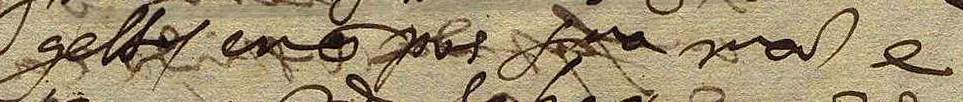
gelhos em q̄ pos sua maõ e
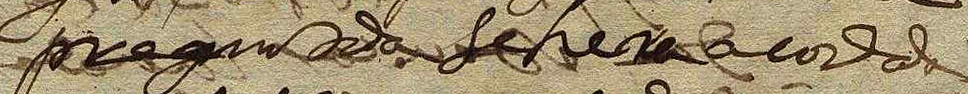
preguntada se hera acordada
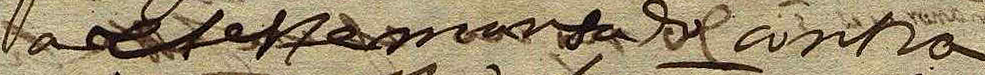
aꝟ testemunhado contra
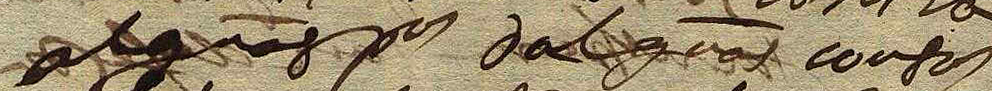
algūas pas dalguās cousas
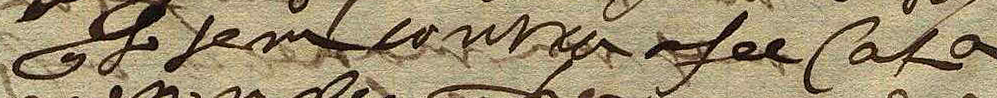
q̄ fosem contra a fee Cata
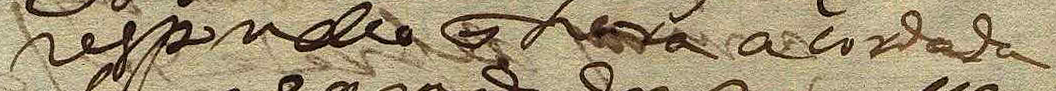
respondeo q̄ hera acordada
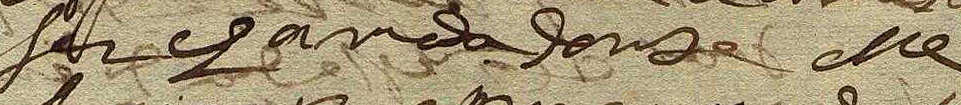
ser chamada dante elle
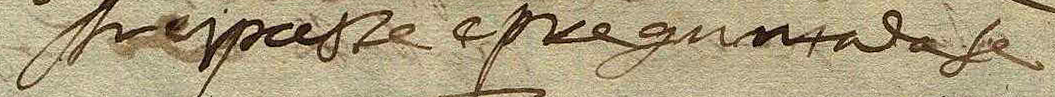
Arcipreste e preguntada se
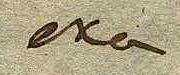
era
